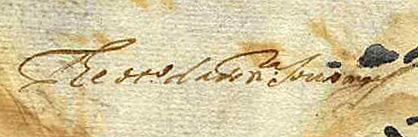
Theot.o da Fonca. Soutomayor
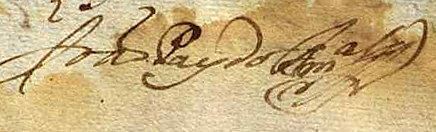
Joaõ Paes do Am.al
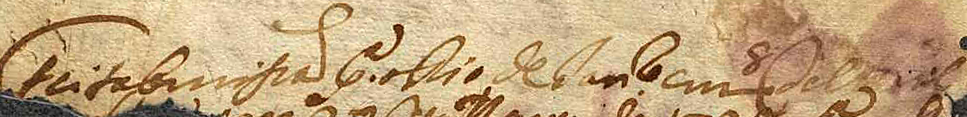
Feita Comissaõ p.a o Rio de Ian.ro em 8 de Abril
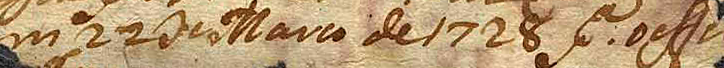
m 22 de Março de 1728 p.a. o effe
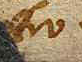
tro.
